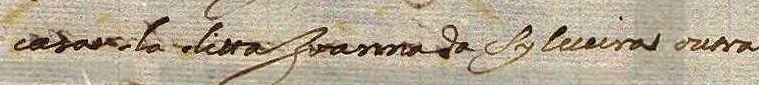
casa da ditta Joanna da Sylveira outra
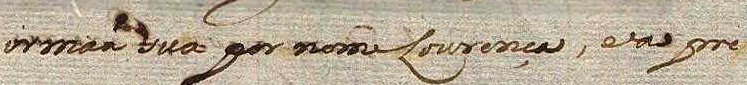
irmaã sua por nome Lourença, e ao pre
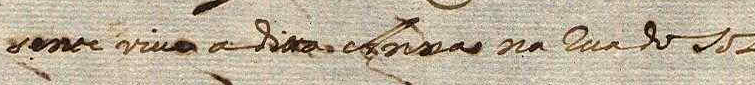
sente viue a ditta Anna na Rua do Sol
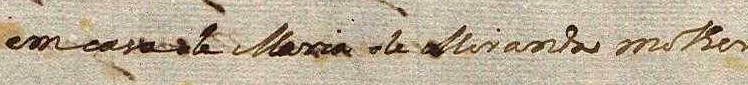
em casa de Maria de Miranda molher
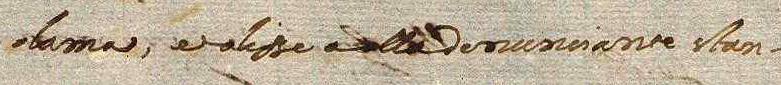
dama, e disse a ella denunciante estan
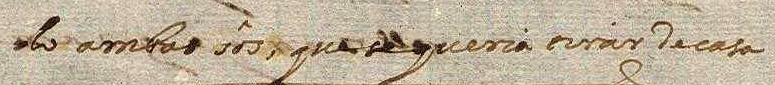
do ambas sôs, que se queria tirar de casa
